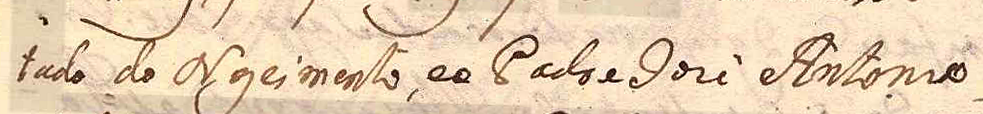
tado do Nascimento, e o Padre Iozé Antonio
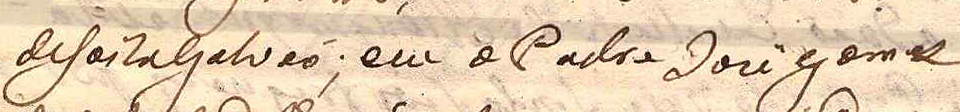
de soiza Galvaõ; e eu o Padre Iozé gomez
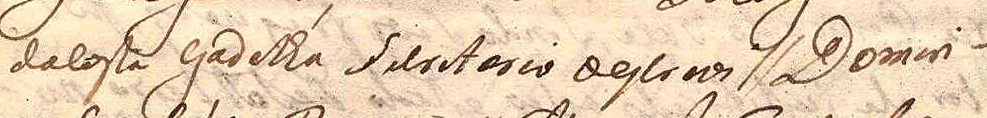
da Costa Gadelha Secretario o escrevi // Domin
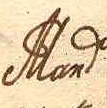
Mand.o
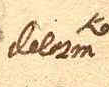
de cazm.to
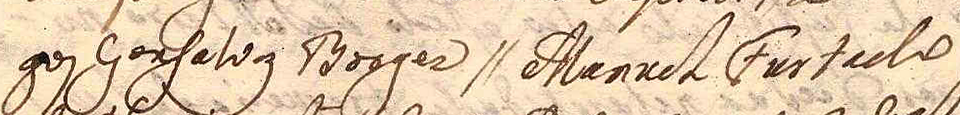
gos Gonsalvez Borgez // Manuel Furtado
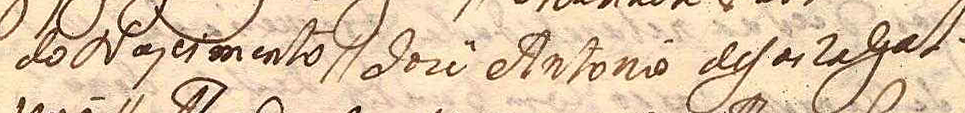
do Nascimento / Iozé Antonio de soiza Gal
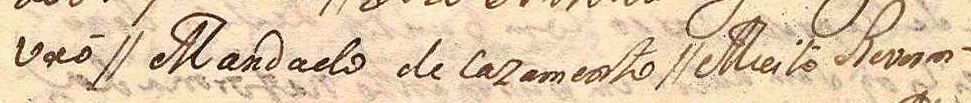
vaõ // Mandado de cazamento // Muito Reveren
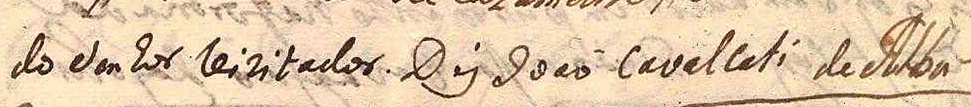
do Senhor Vizitador. Dis Ioaõ Cavalcati de Albu
